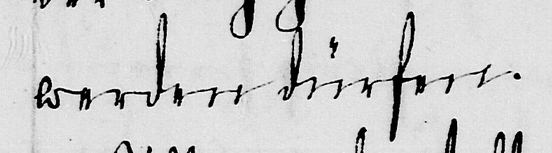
werden dürfen.
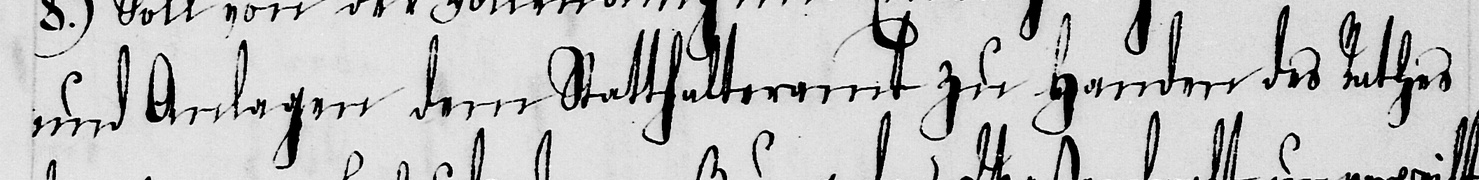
und Anlagen dem Statthalteramt zu Handen des Rathes
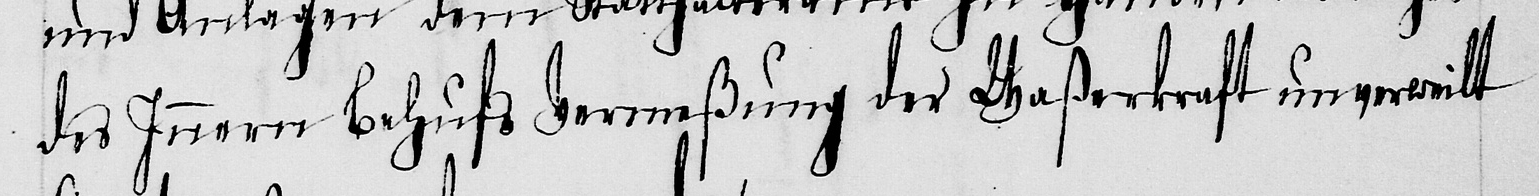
des Innern Behufs Vermeßung der Waßerkraft unverweilt
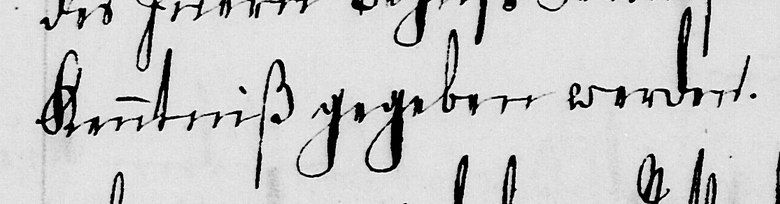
Kenntniß gegeben werden.
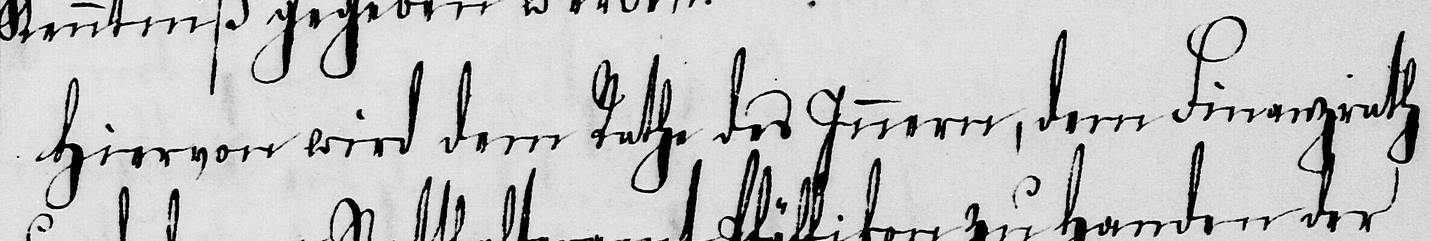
Hiervon wird dem Rathe des Innern, dem Finanzrath
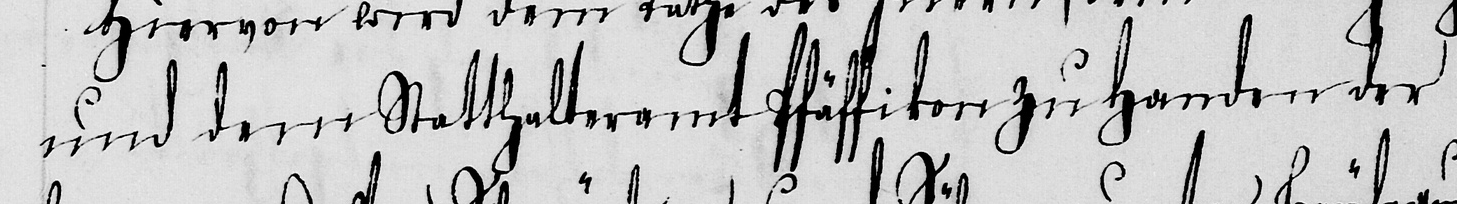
und dem Statthalteramt Pfäffikon zu Handen der
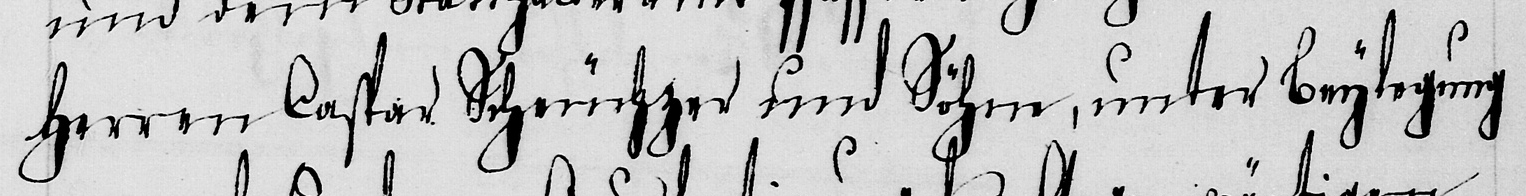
Herren Caspar Scheuchzer und Söhne, unter Beylegung
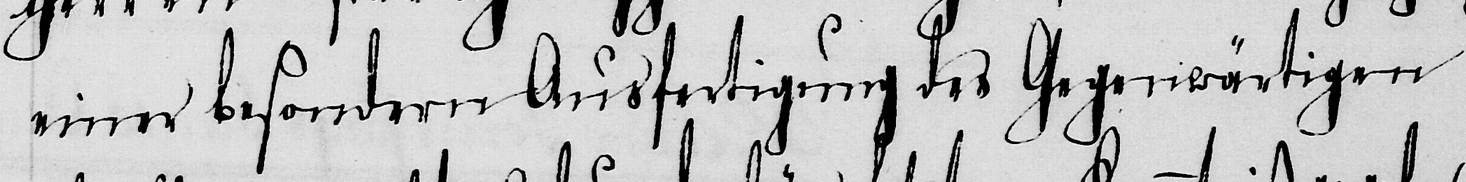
einer besondern Ausfertigung des Gegenwärtigen
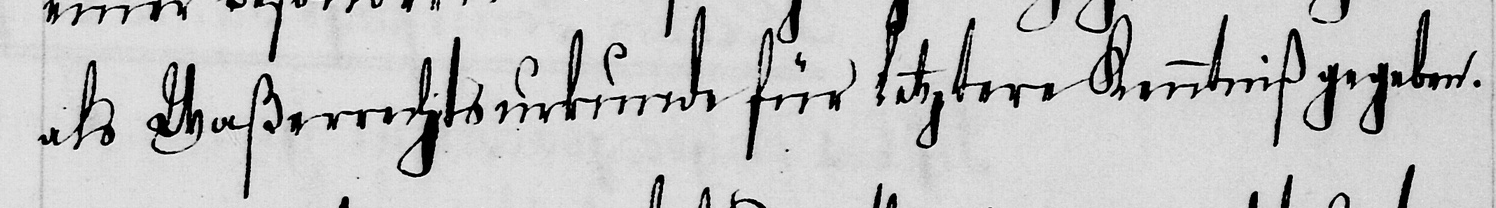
als Waßerrechtsurkunde für Letztern Kenntniß gegeben.
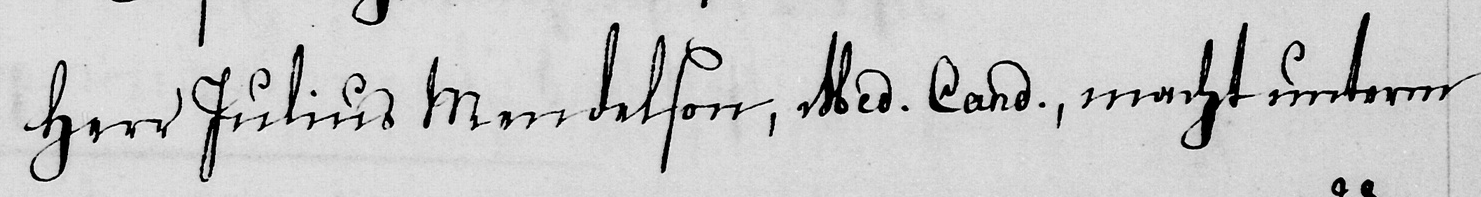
Herr Julius Mendelson, Med. Cand., macht unterm
